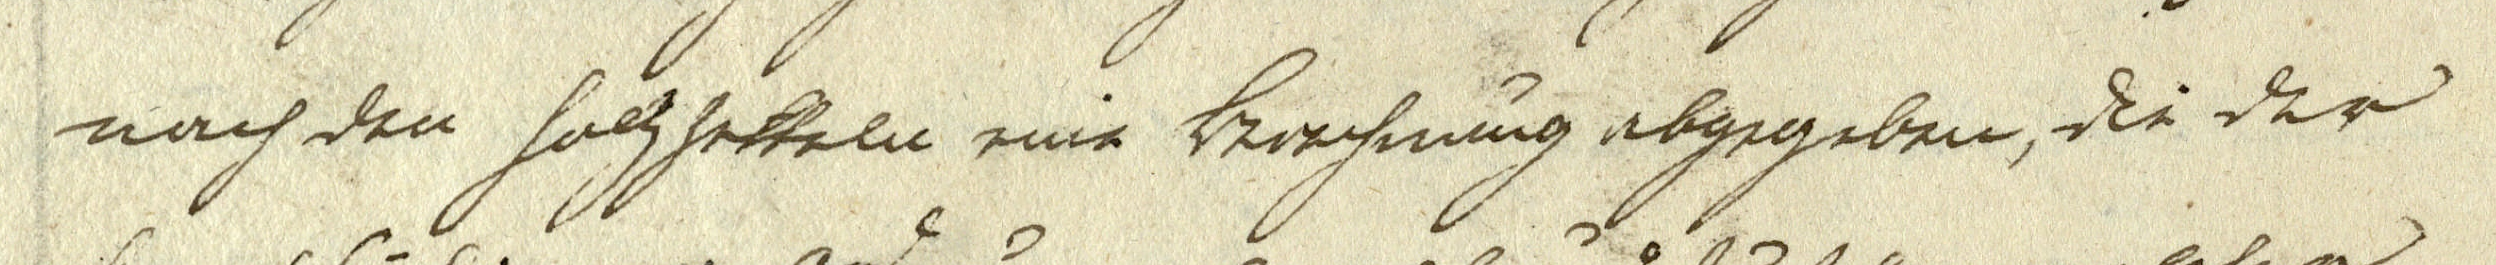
nach den Holzzetteln eine Berechnung abgegeben, die der
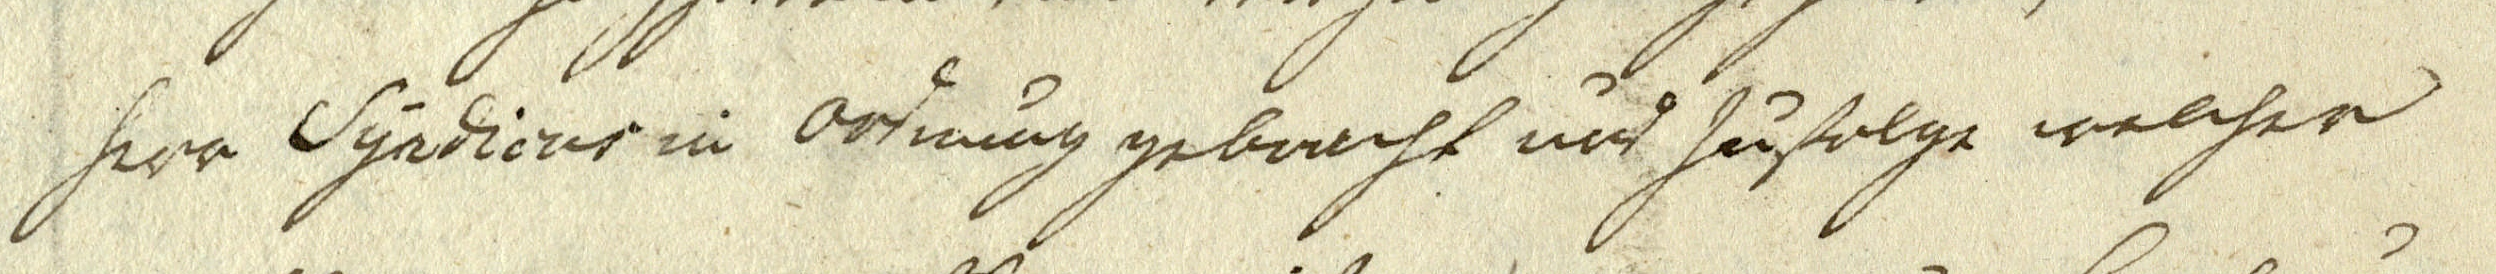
Herr Sÿndicus in Ordnung gebracht und zufolge welcher
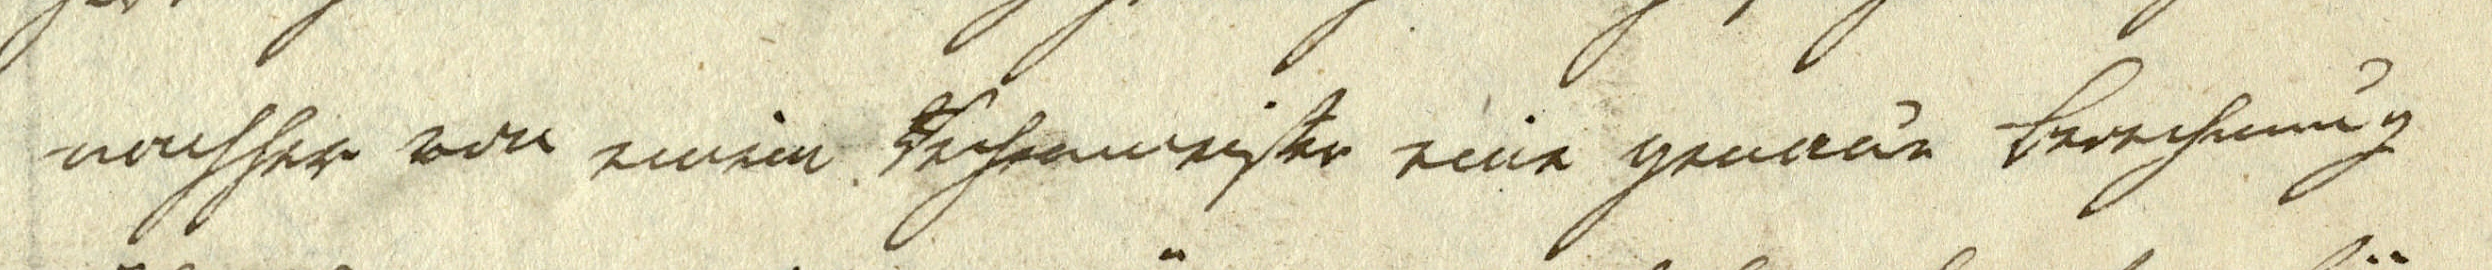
nachher von einem Rechenmeister eine genaue Berechnung
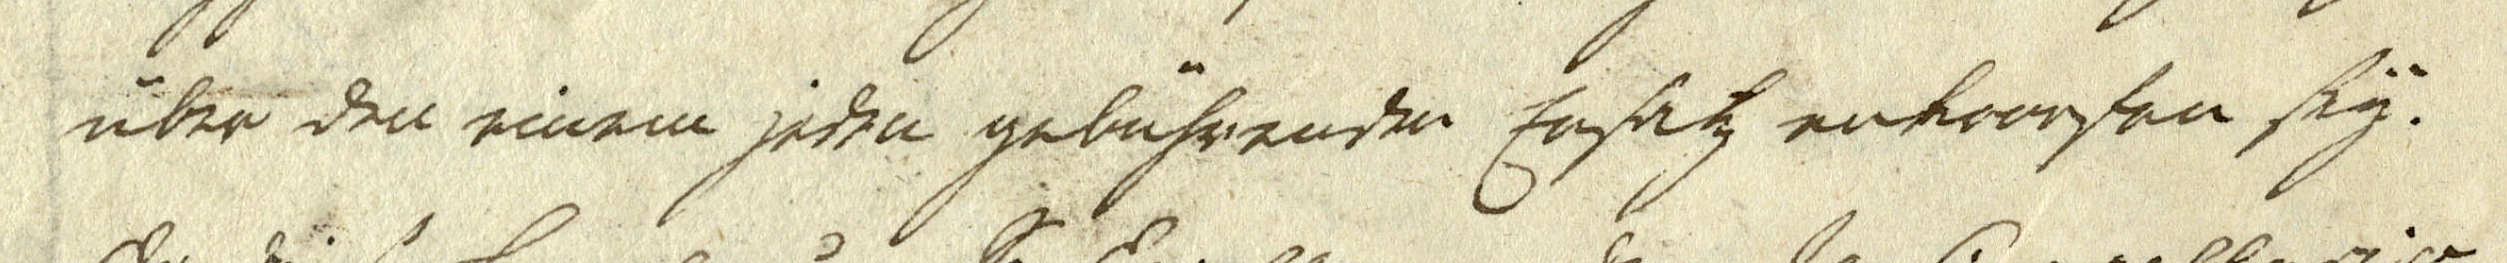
über den einem jeden gebührenden Ersatz entworfen seÿ.
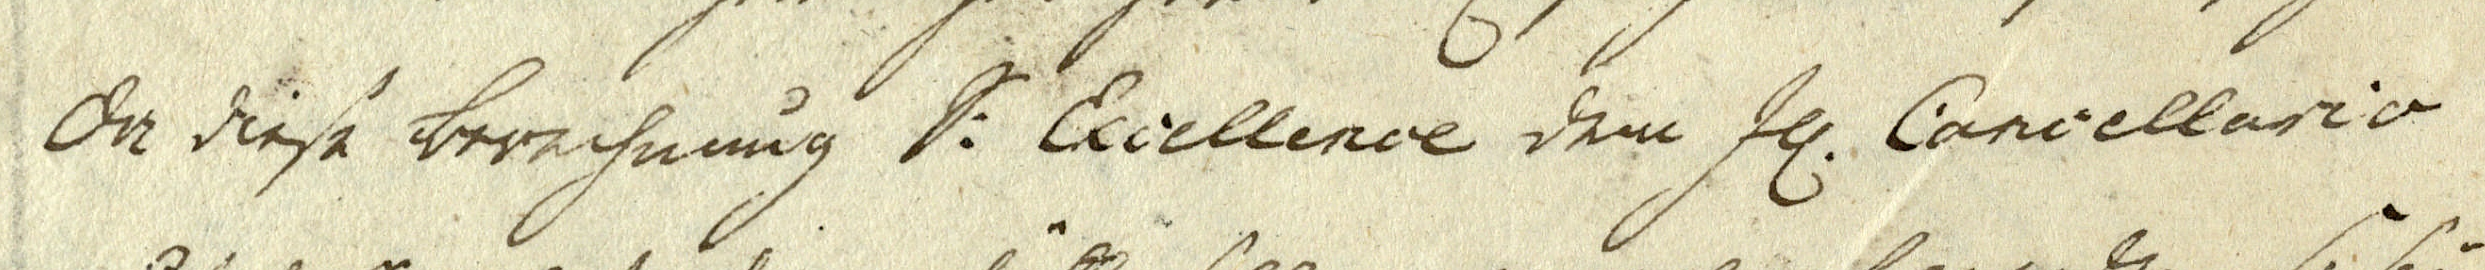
Da diese Berechnung Sr. Excellence dem dh. Cancellario
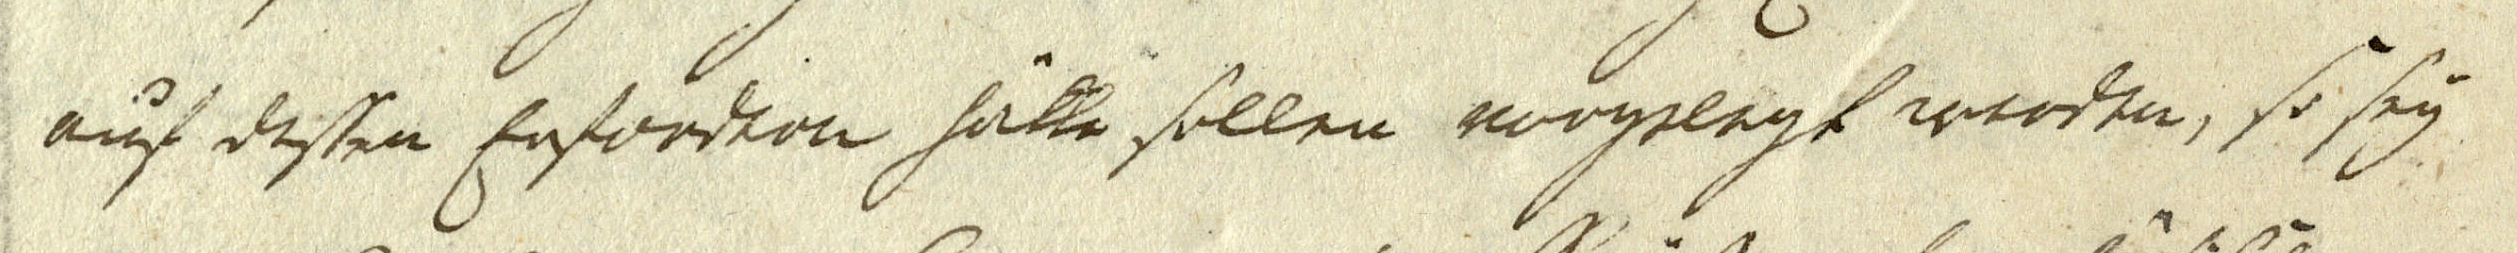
auf dessen Erfordern hätte sollen vorgelegt werden, so seÿ
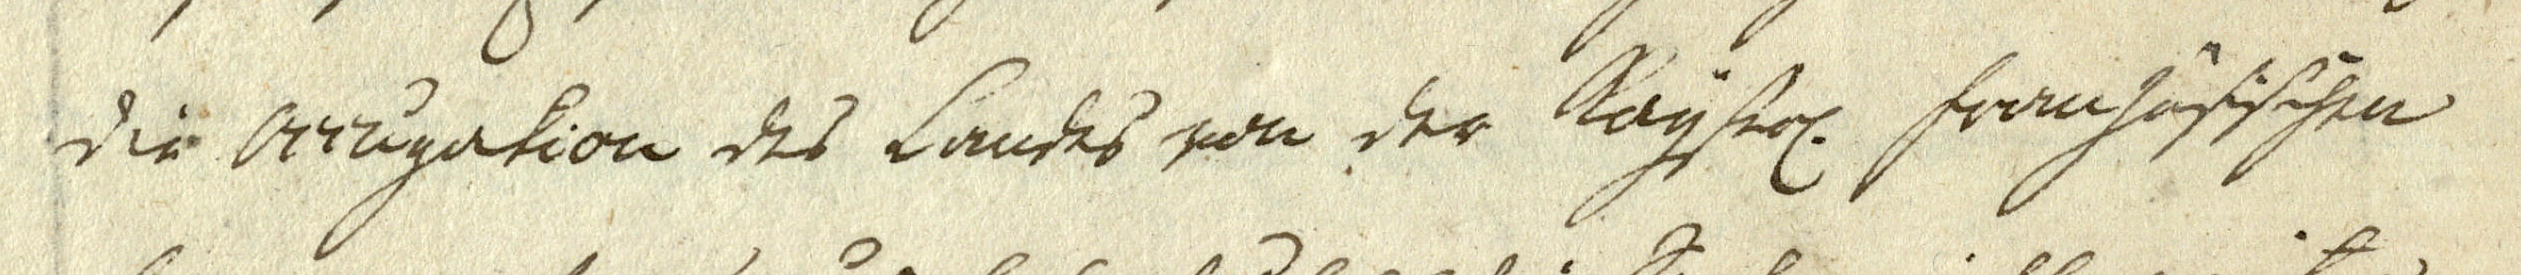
die Occupation des Landes von der Kaÿserl. Französischen
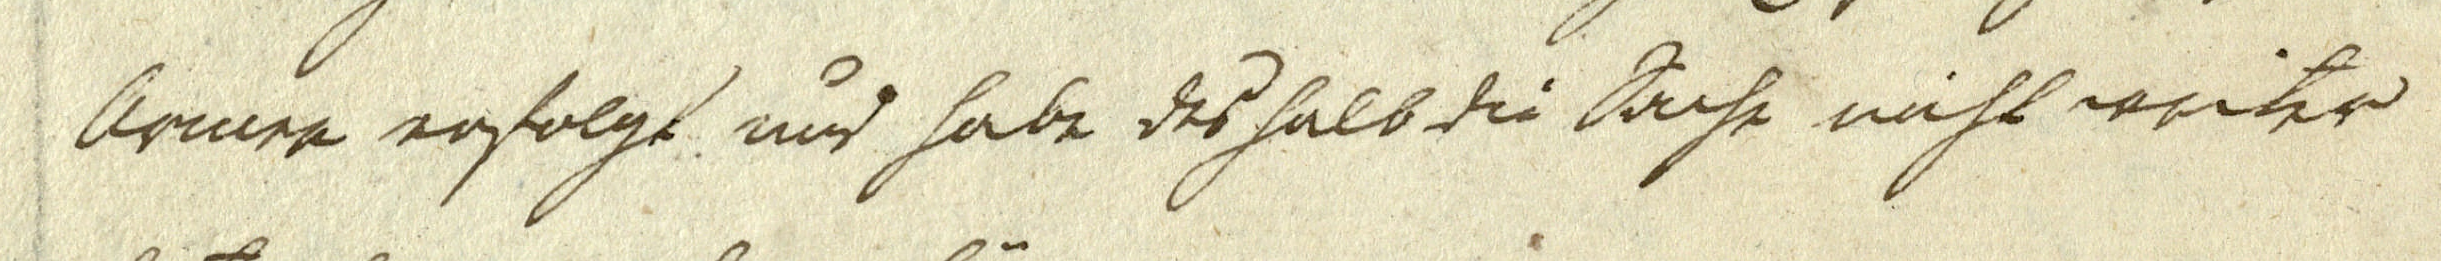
Armee erfolgt und habe deshalb die Sache nicht weiter
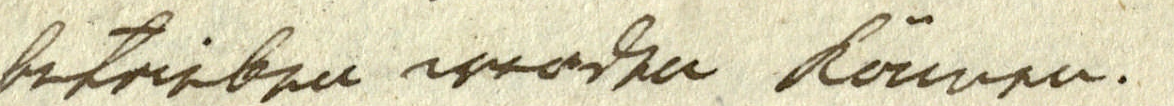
betrieben werden können.
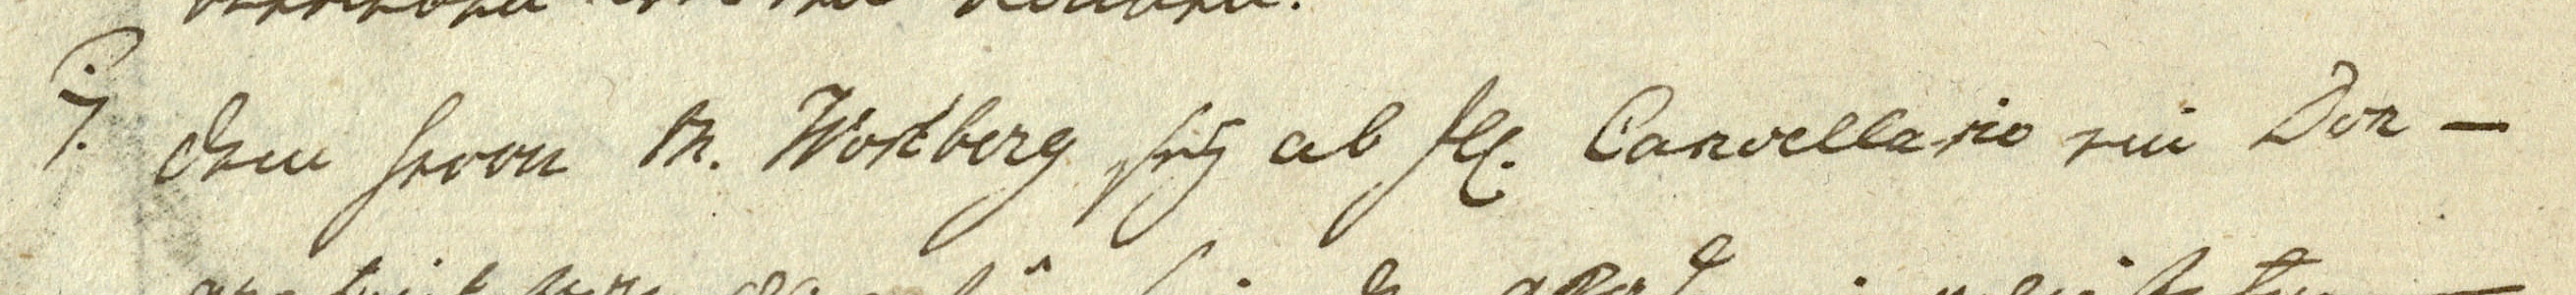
7. Dem Herrn M. Wortberg seÿ ab Ill. Cancellario ein Don-
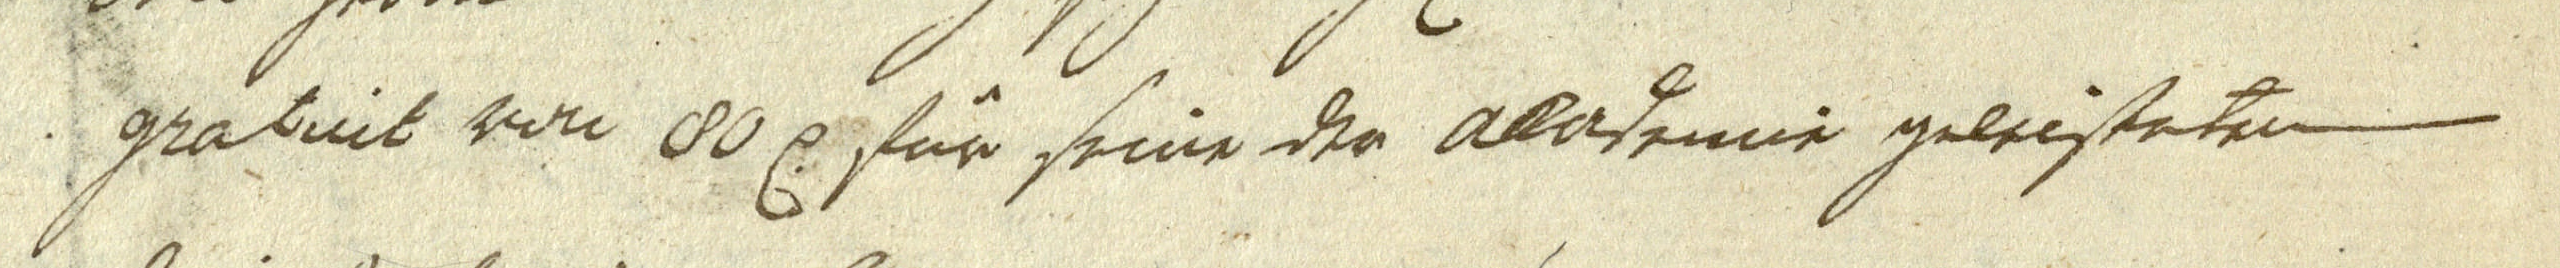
gratuit von 80 l. für seine der Akademie geleisteten
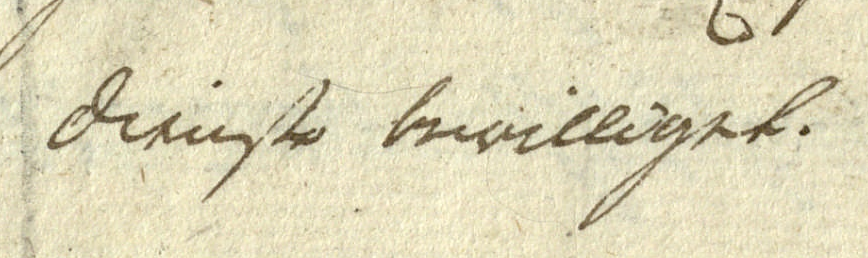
Dienste bewilliget.
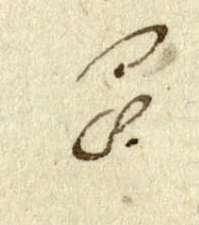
8.
